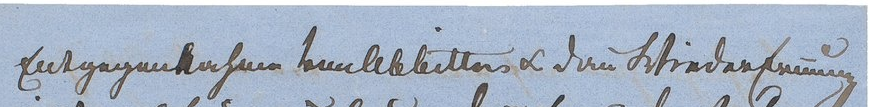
Entgegenahme von Abbitten & dann Wieder Ernennung
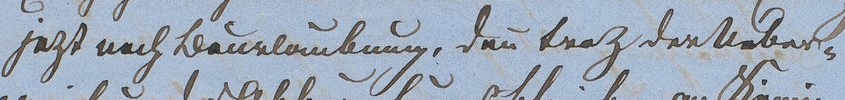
jezt nach Beurlaubung, denn troz der Ueber-
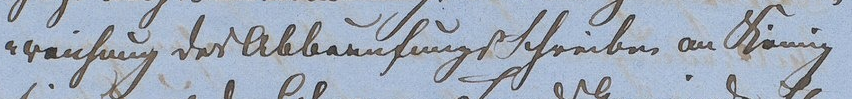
reichung des Abberufungs Schreiben an König
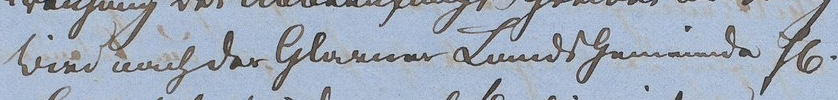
wird nach der Glarner Landsgemeinde Hr.
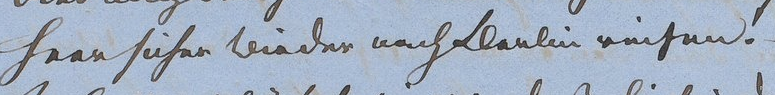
Heer sicher wieder nach Berlin reisen. –
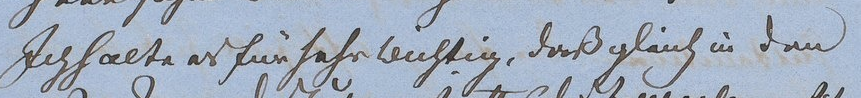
Ich halte es für sehr wichtig, daß gleich in den
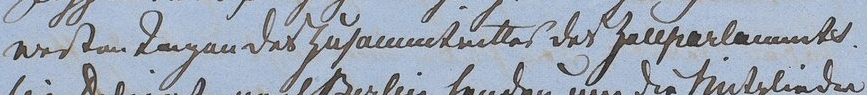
ersten Tagen des Zusammentrittes des Zollparlaments
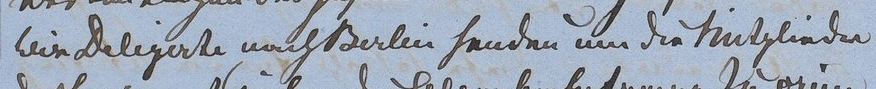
wir Delegirte nach Berlin senden um die Mitglieder
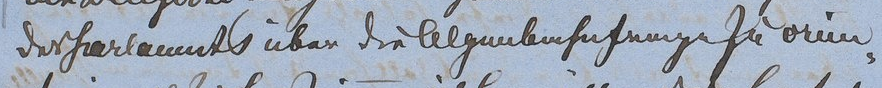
des Parlaments über die Alpenbahnfrage zu orien-
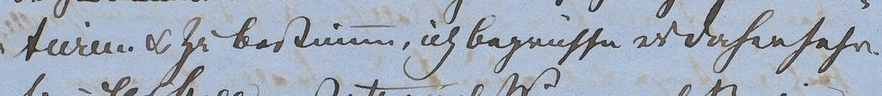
tieren & zu bestimmen, ich begrüsse es daher sehr
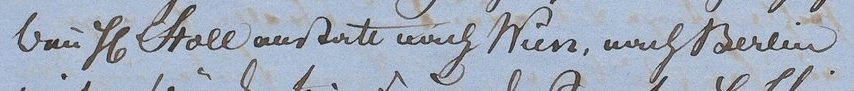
wenn Hr Stoll anstatt nach Wien, nach Berlin
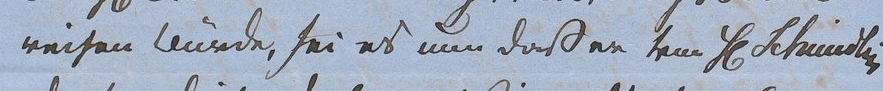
reisen würde, sei es nun daß er von Hr Schmidlin
